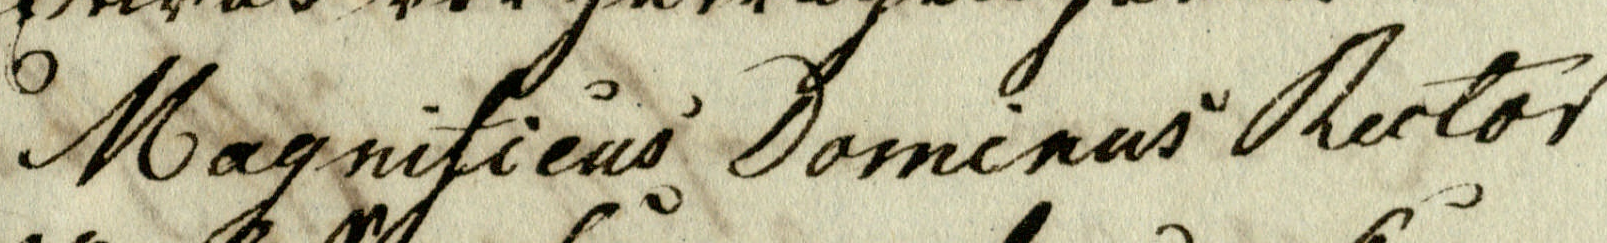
Magnificus Dominus Rector
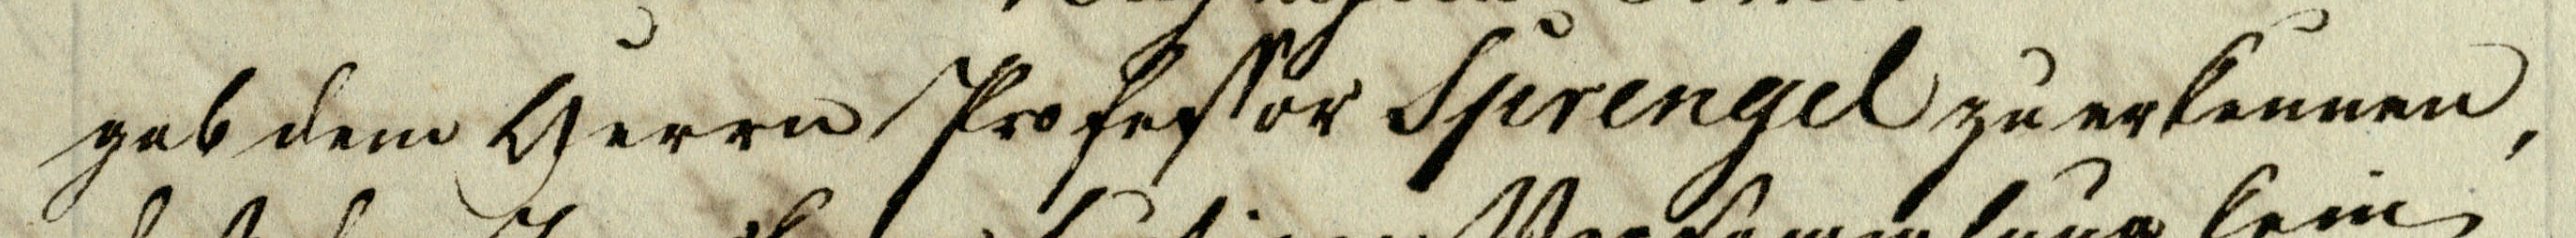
gab dem Herrn Professor Sprengel zu erkennen,
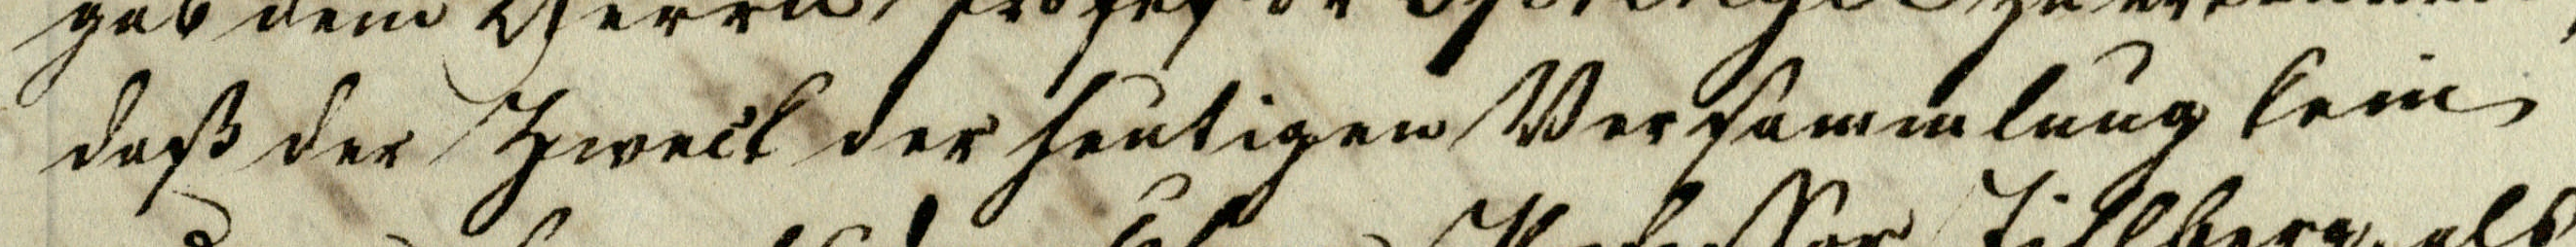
daß der Zweck der heutigen Versammlug kein
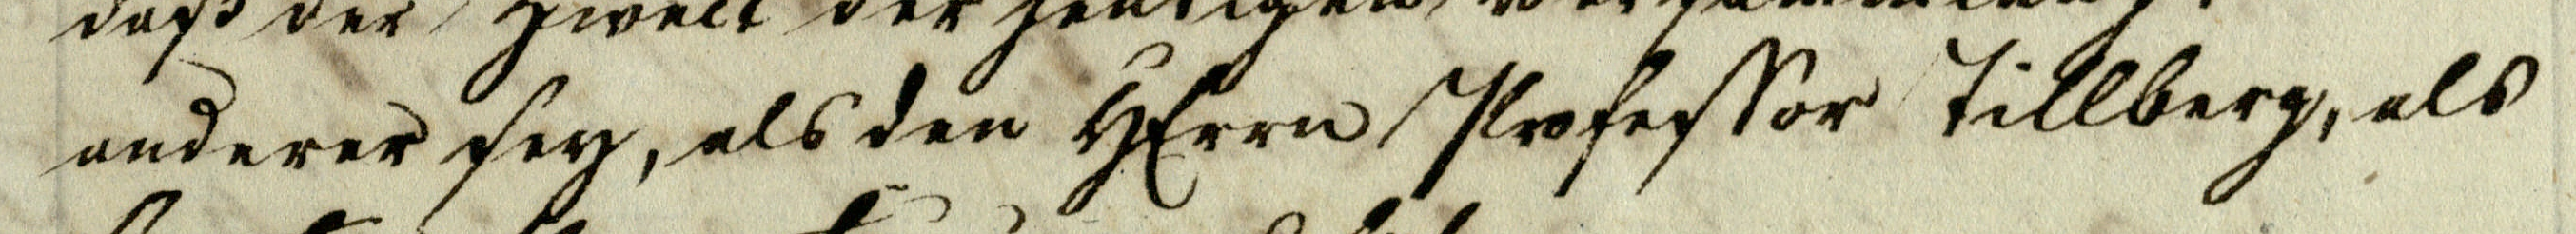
anderer sey, als den Herrn Professor Tillberg, als
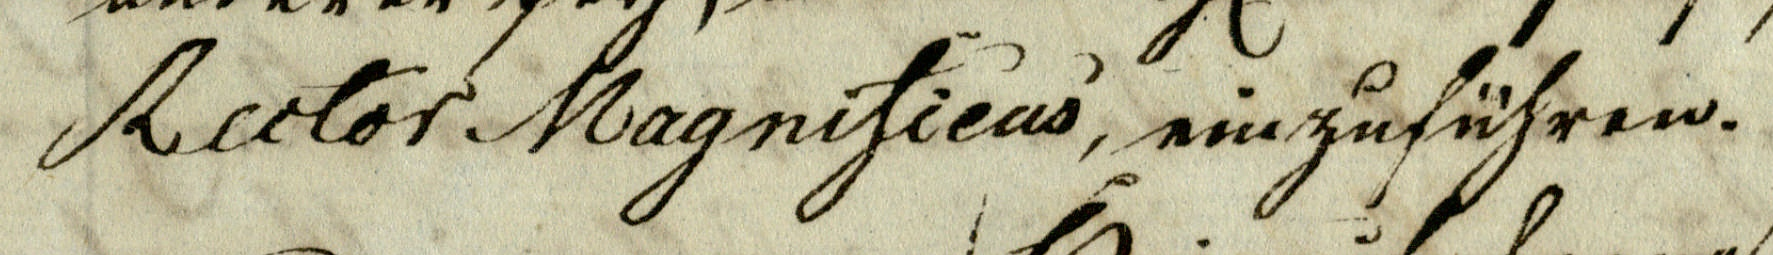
Rector Magnificus, einzuführen.
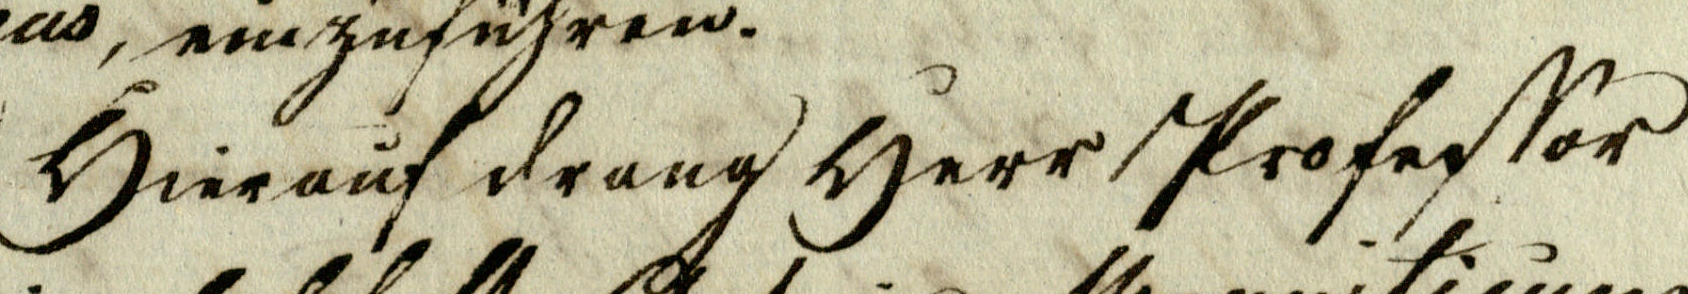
Hierauf drang Herr Professor
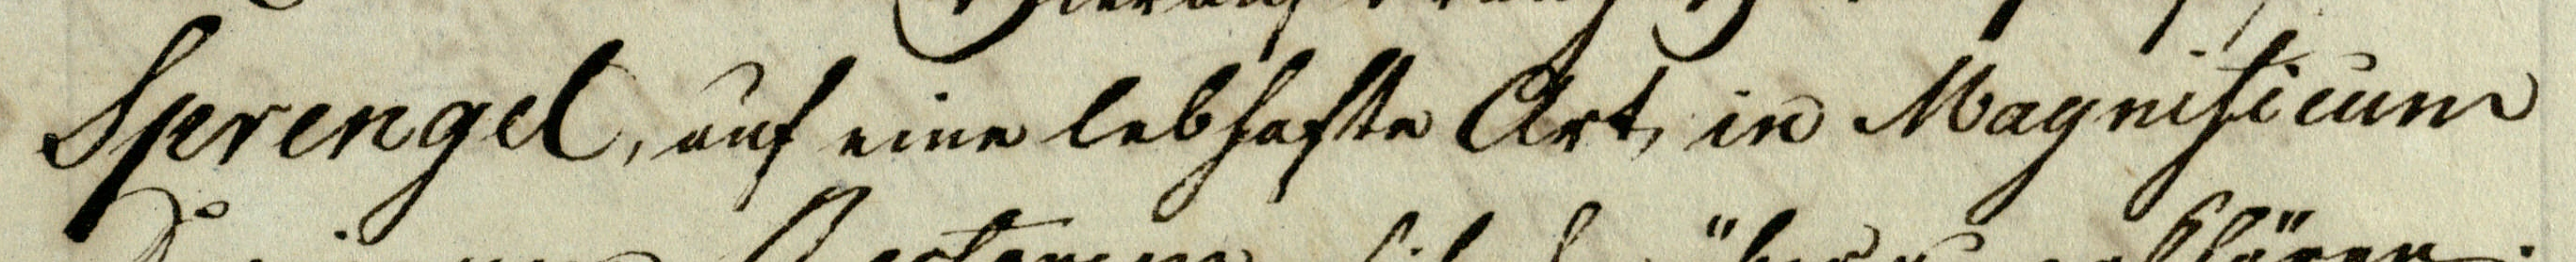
Sprengel auf eine lebhafte Art, in Magnificum
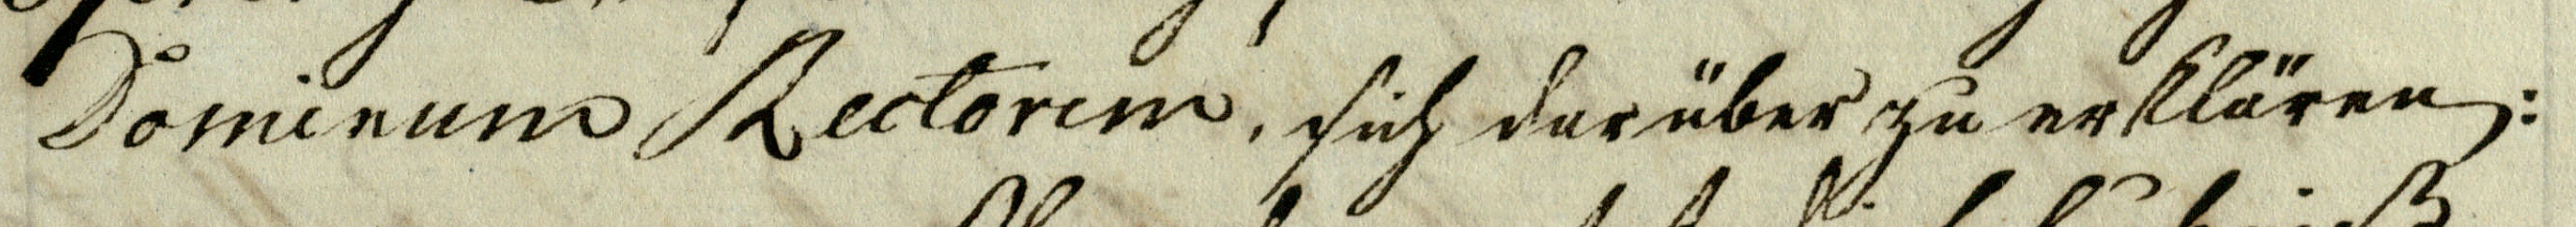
Dominum Rectorem, sich darüber zu erklären:
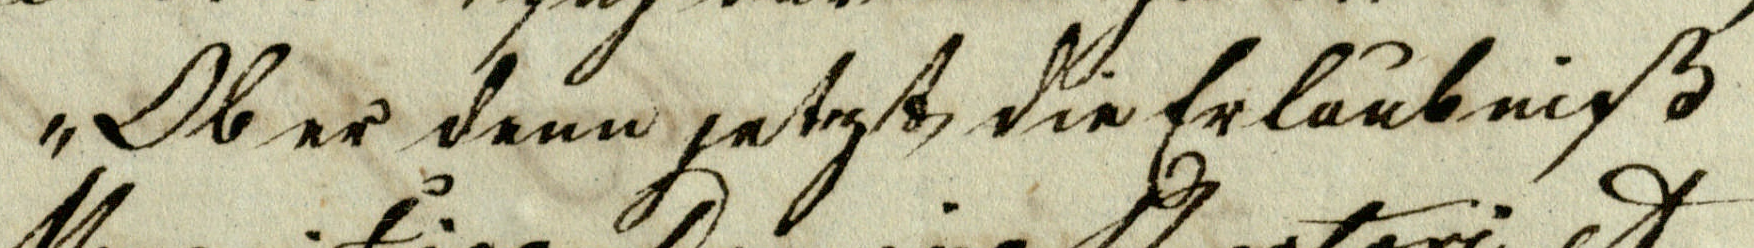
"Ob er denn jetzt die Erlaubniß
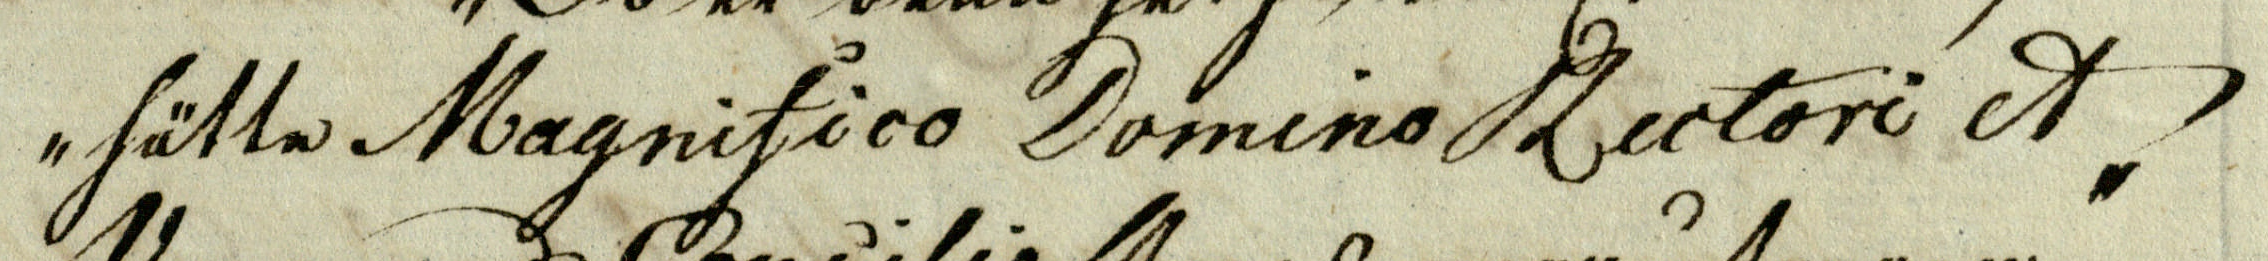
"hätte Magnifico Domino Rectori et
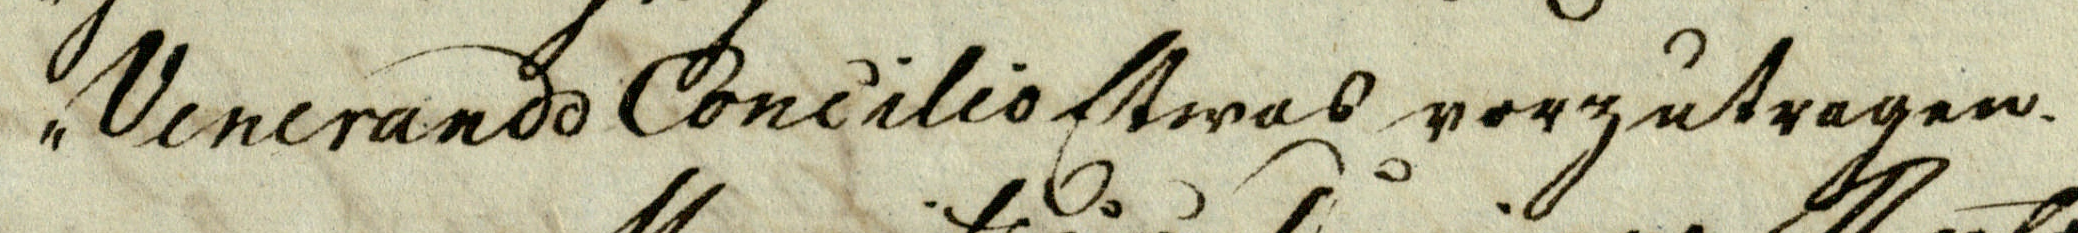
"Venerando Concilio Etwas vorzutragen."
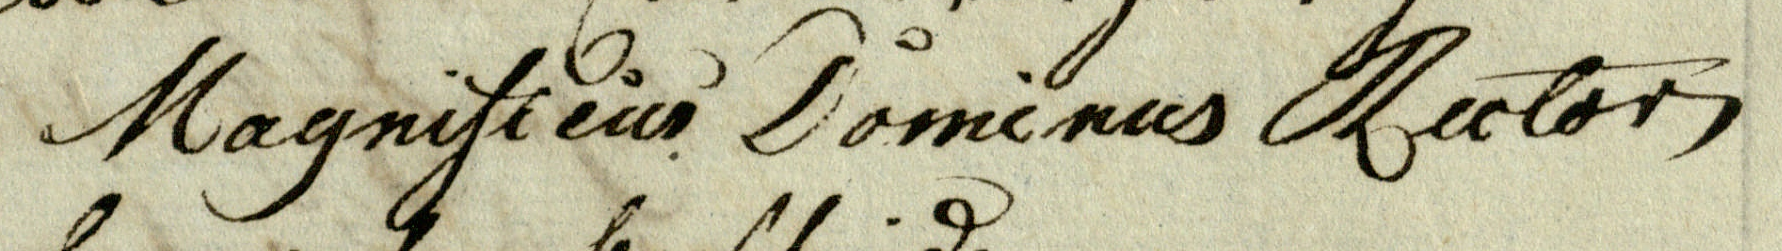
Magnificus Dominus Rector
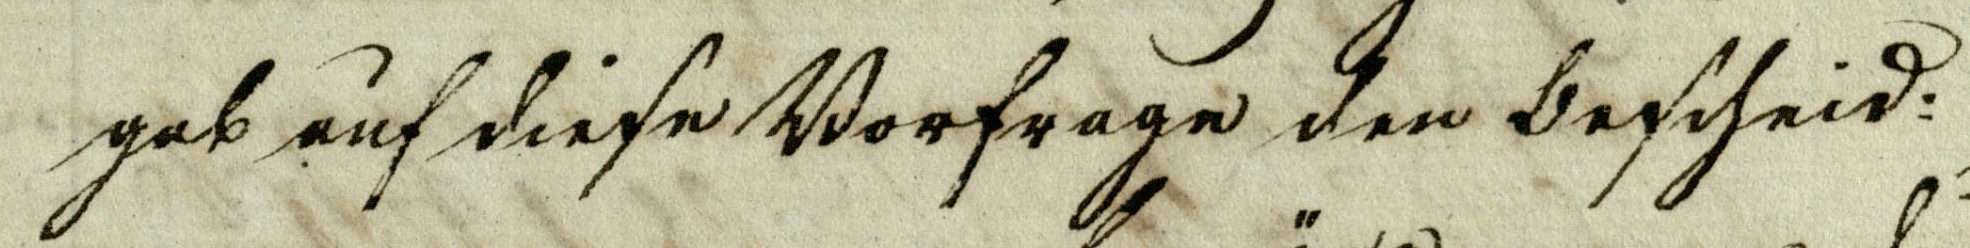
gab auf diese Vorfrage den Bescheid:
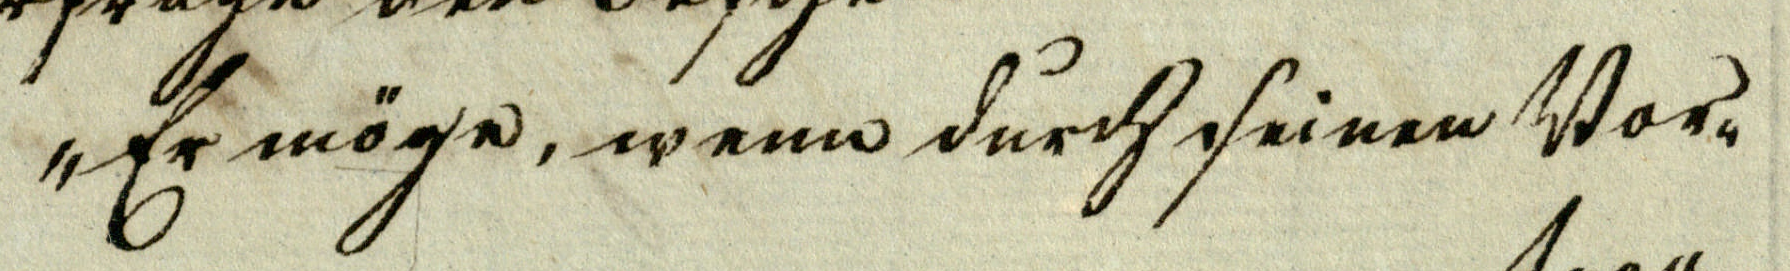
"Er möge, wenn durch seinen Vor¬
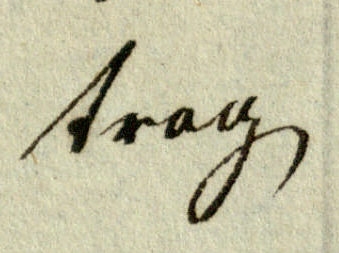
trag
